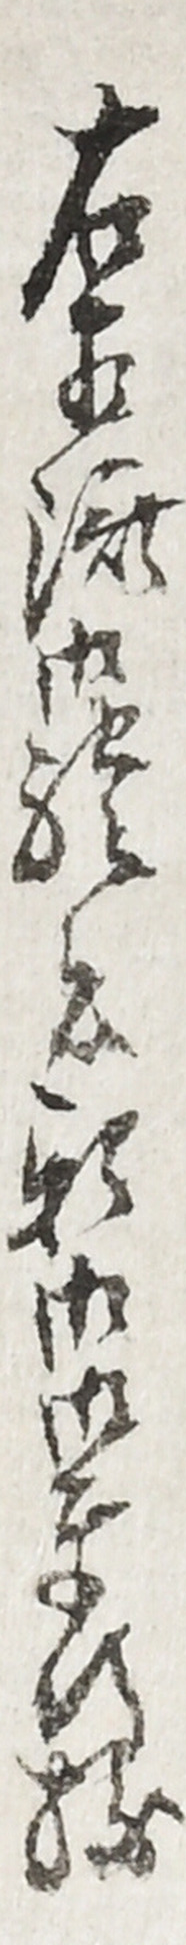右相済御礼者新御御奉行様
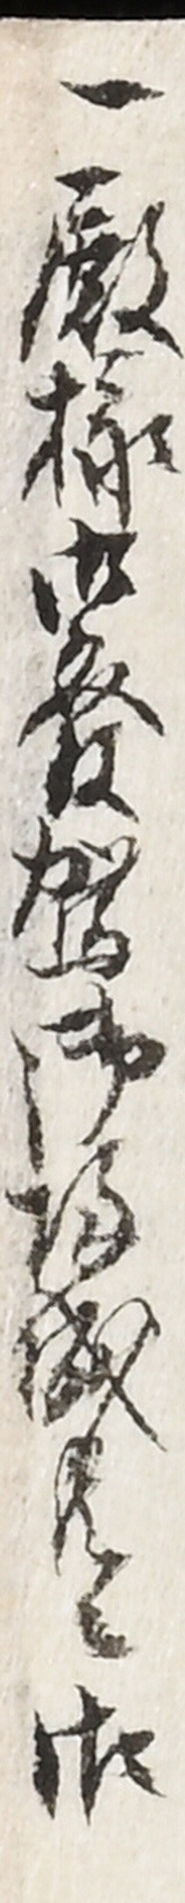一殿様御発駕御帰城共ニ御
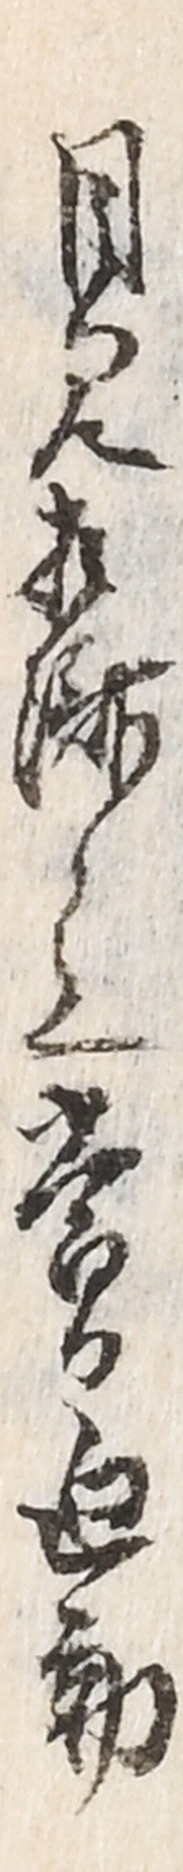目見相済之上当日廻勤
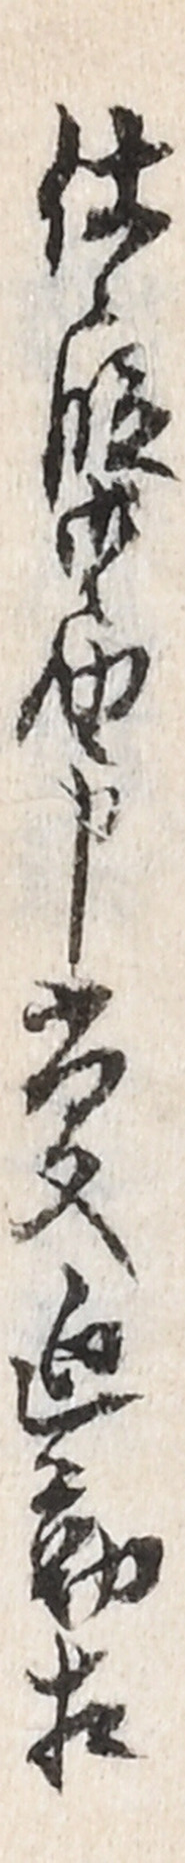仕候段御届申六文廻勤相
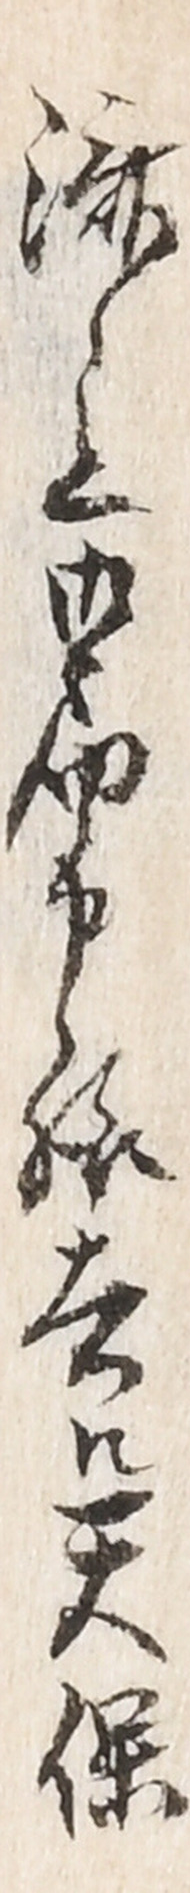済之上御届申候様去ル天保
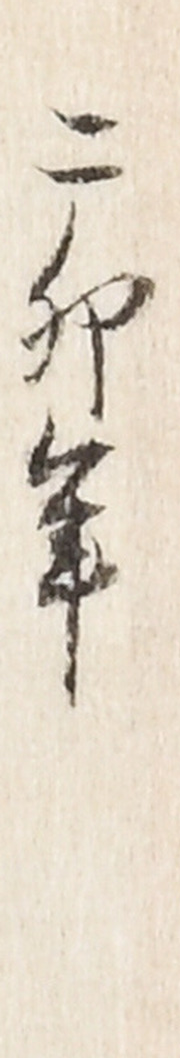二卯年
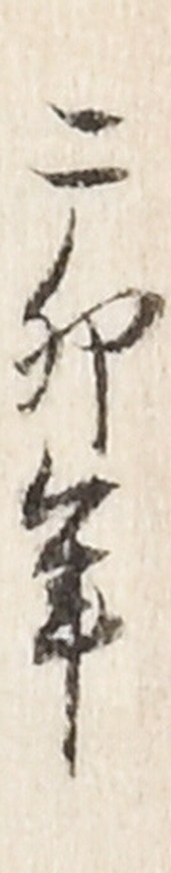二卯年
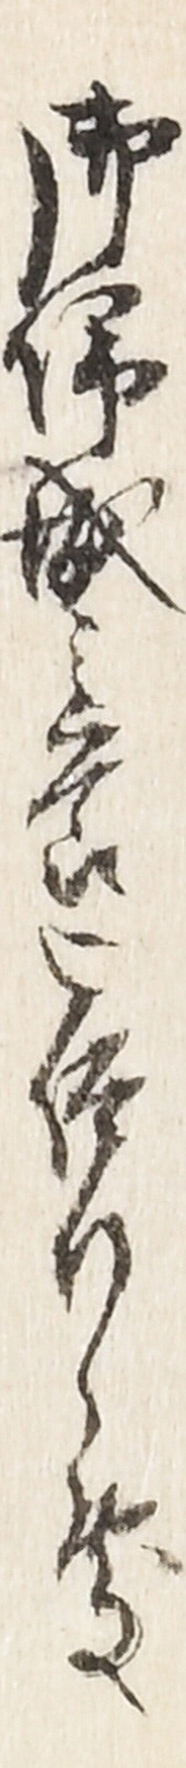御帰城之節被仰付候処
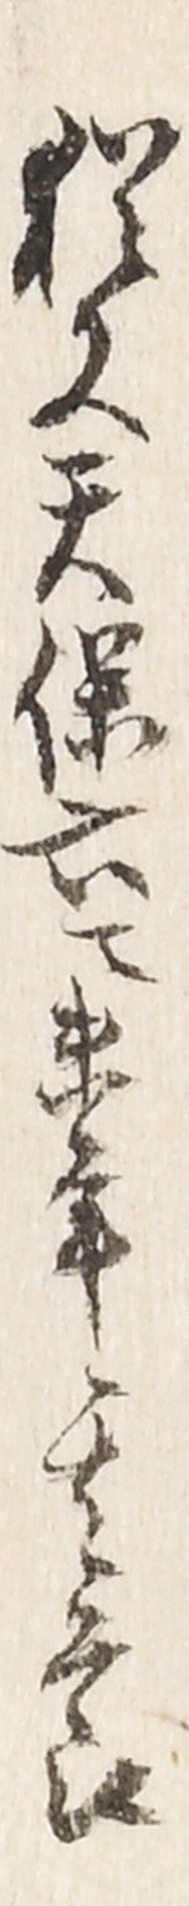猶又天保六乙未年ニ其節
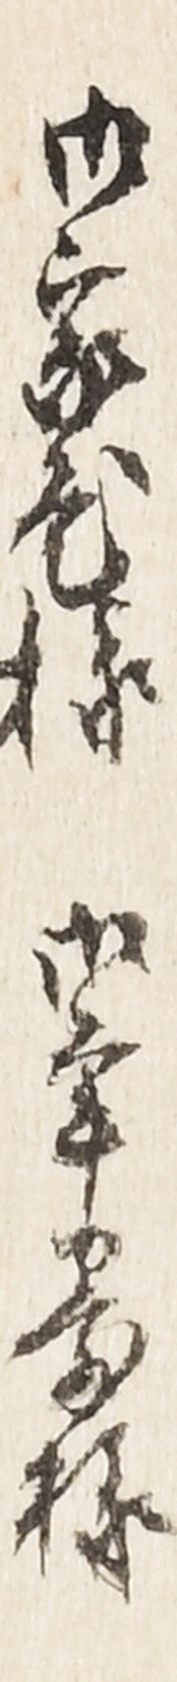御家老様御年寄様
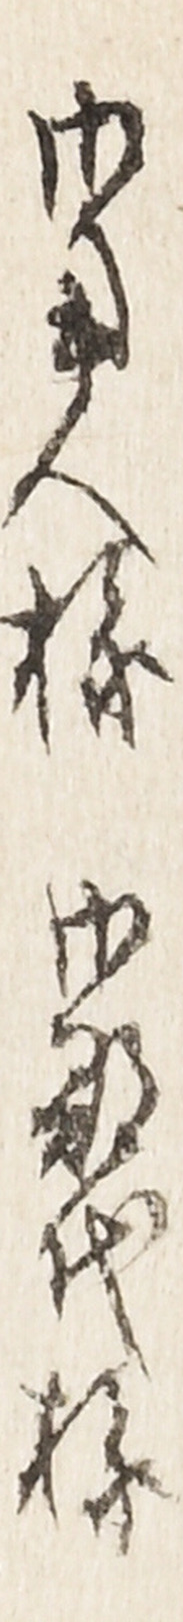御用人様御郡代様
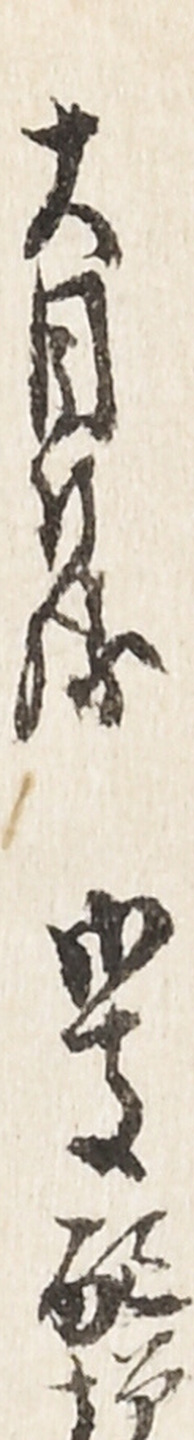大目付様御支配様
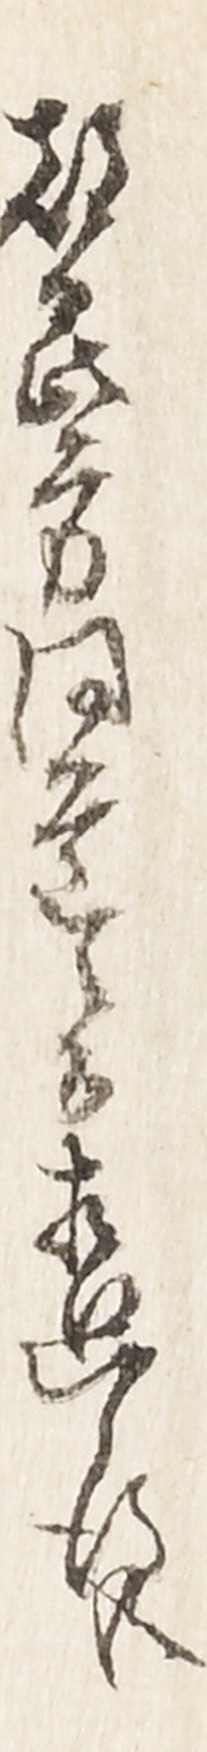都而此方同道ニ而相廻候得共
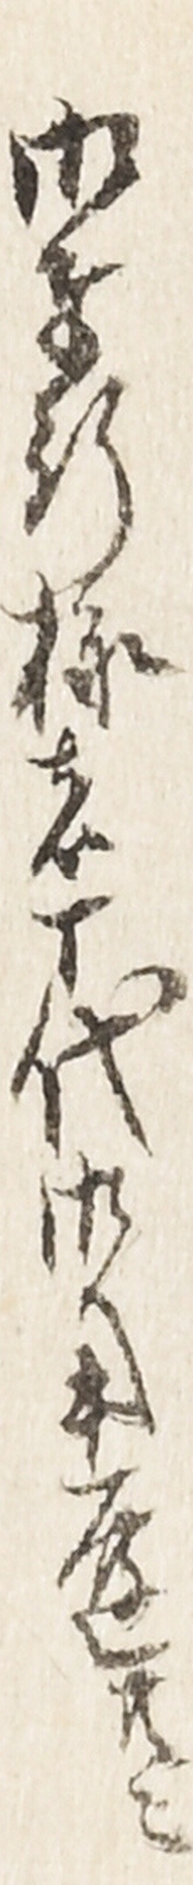御奉行様は丁代御用達共ニ
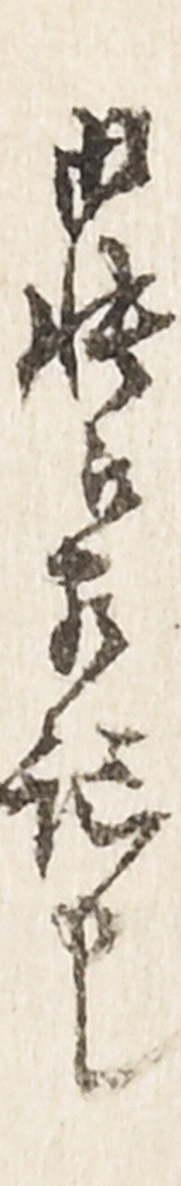御帳江相記申候
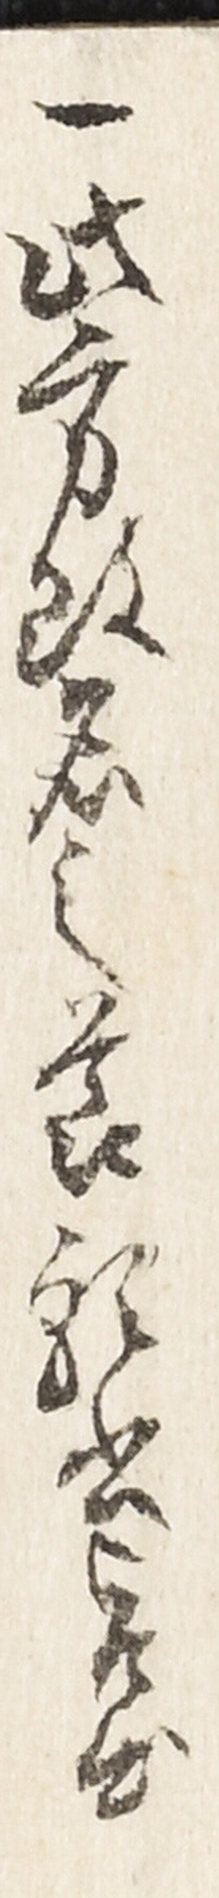一此方改名之節願書差出
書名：年内行事懐中録
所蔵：伊那市立高遠町図書館・合同会社AMANE
